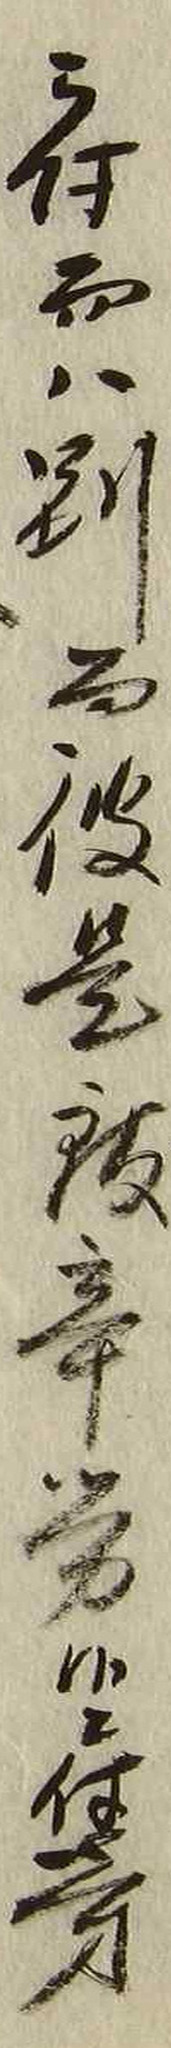ニ付而ハ別而彼是致辛労候ニ付旁
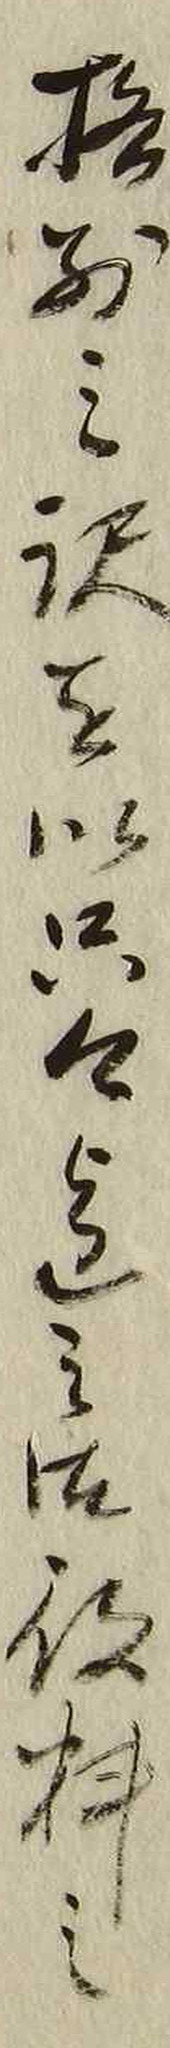格別之訳を以只今迄之御役料之
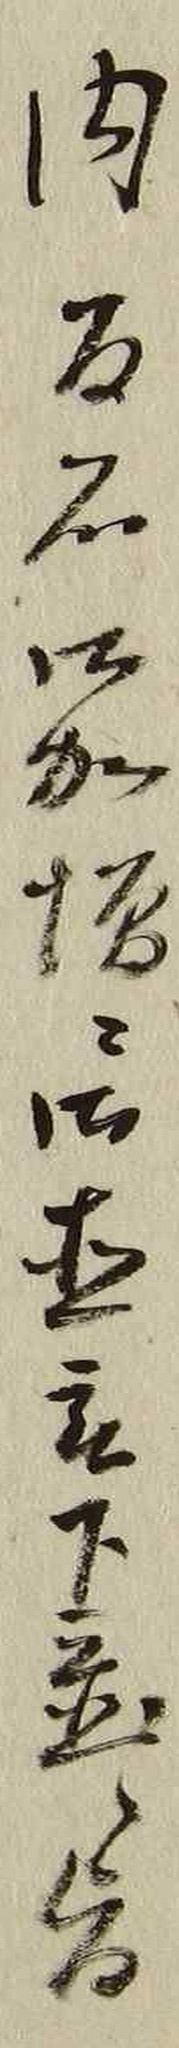内百石御加増ニ御直被下置候旨
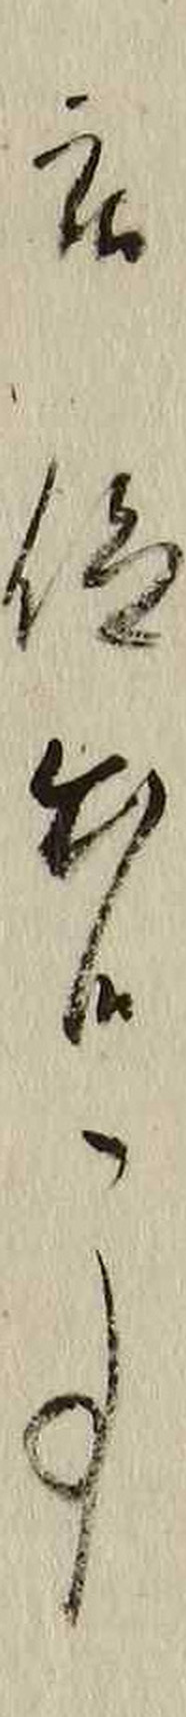被仰出候事
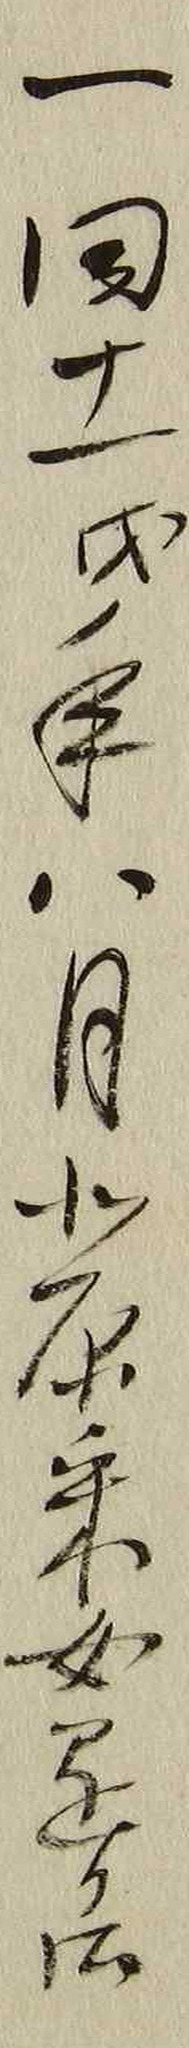一同十一戌年八月北原采女懸り御
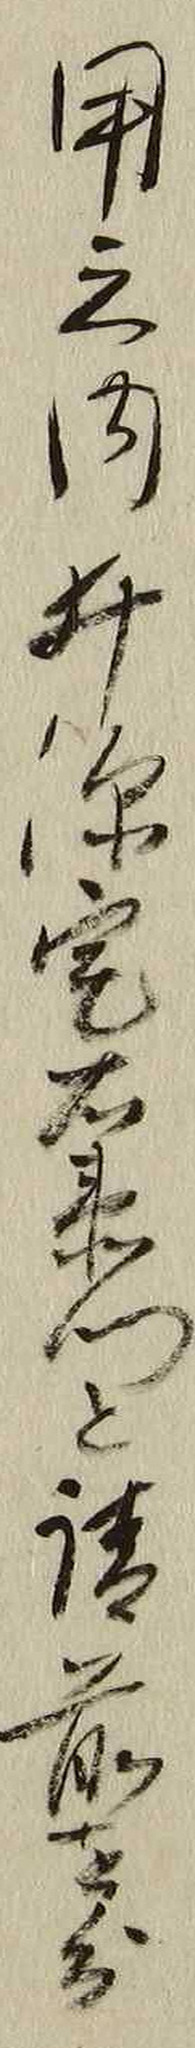用之内井深宅右衛門と請前を分
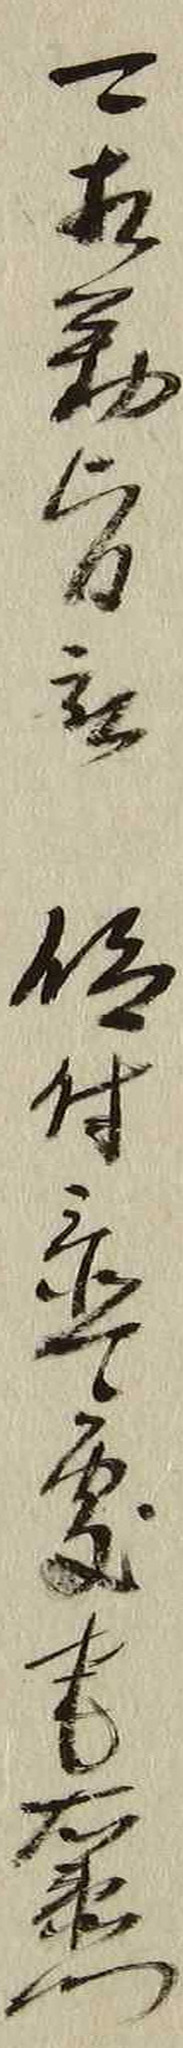可相勤旨被仰付置候処宅右衛門
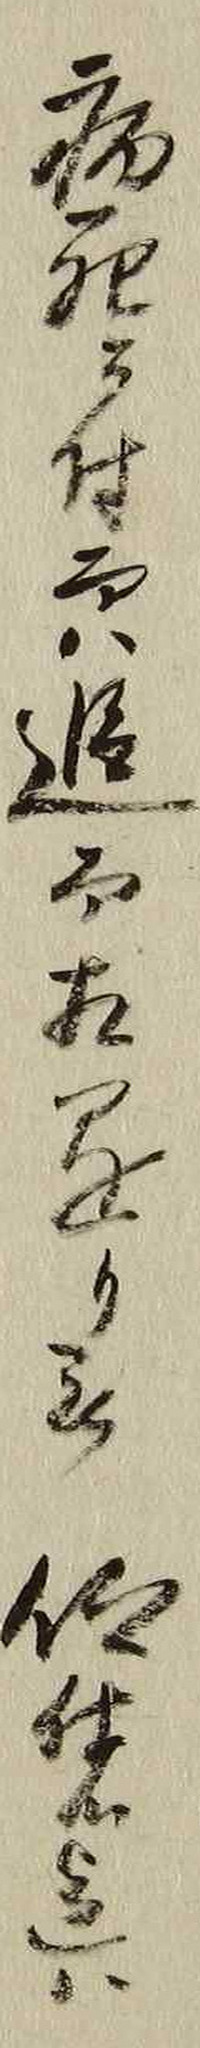病死ニ付而ハ追而相懸り被仰付候迄ハ
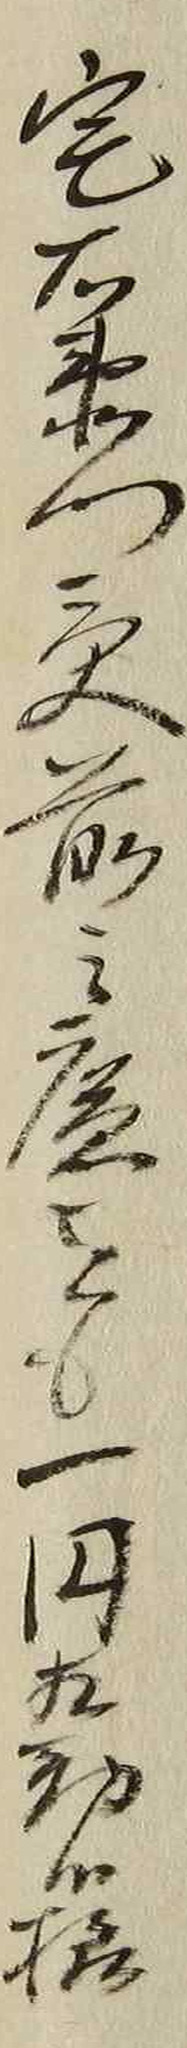宅右衛門受前之廉をも一円相勤候様
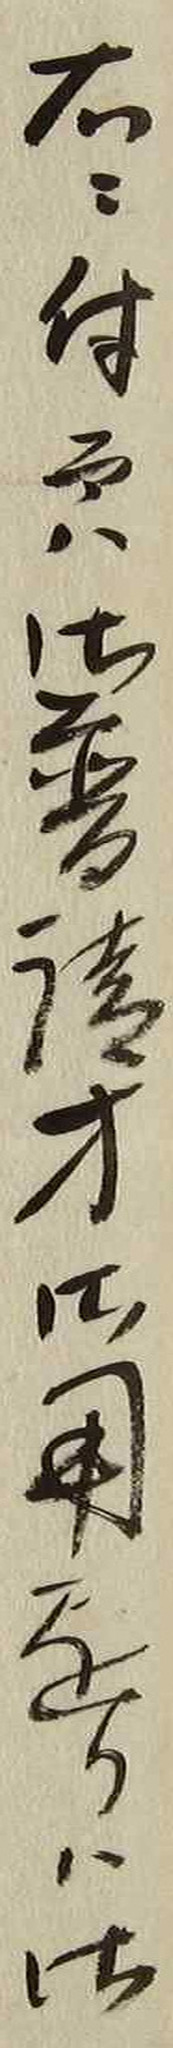右ニ付而ハ御普請方御用懸りハ御
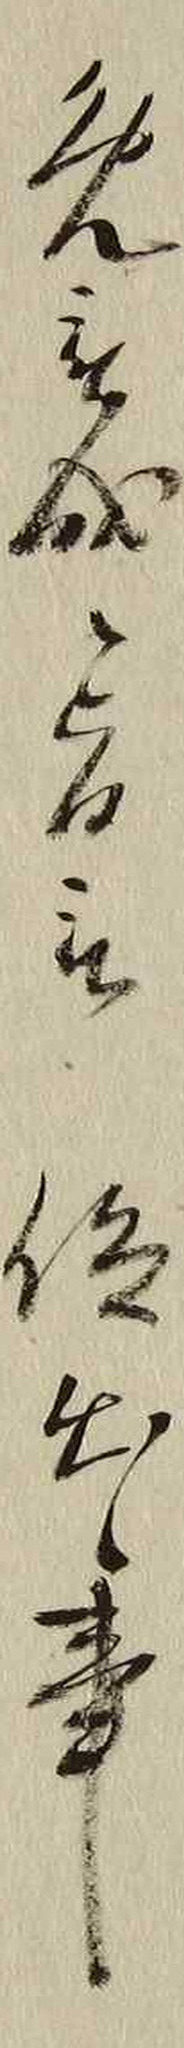免被成候旨被仰出候事
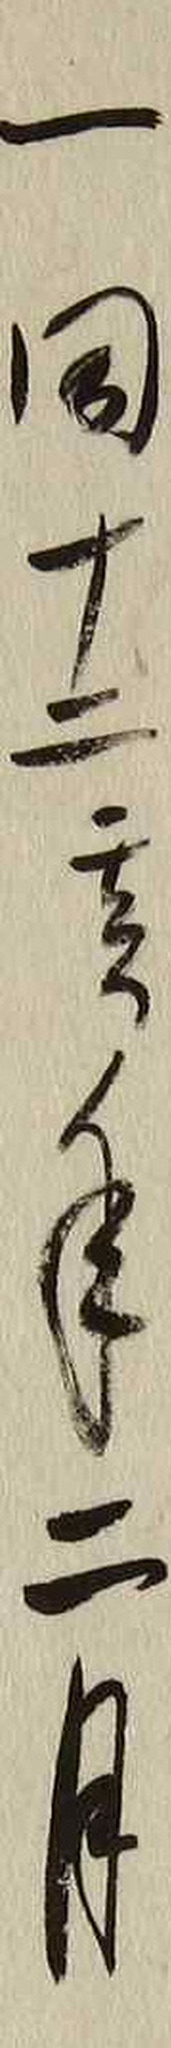一同十二亥年二月
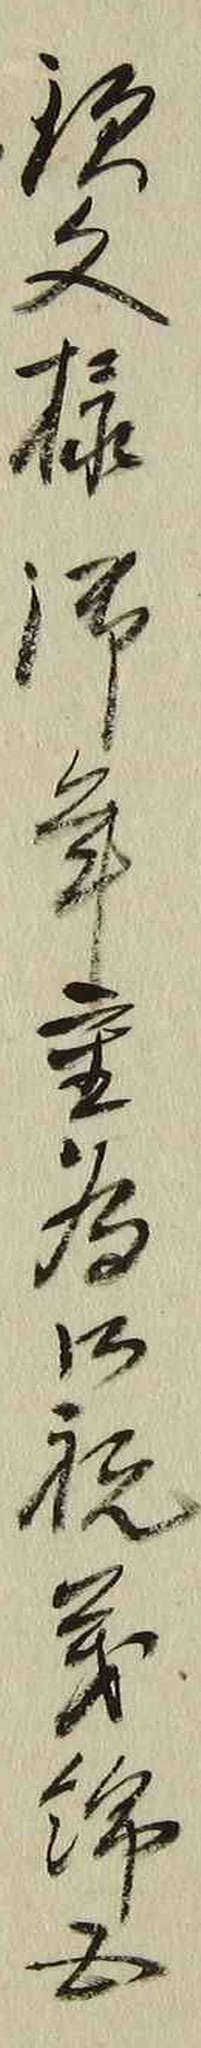欽文様御年重為御祝義綿五
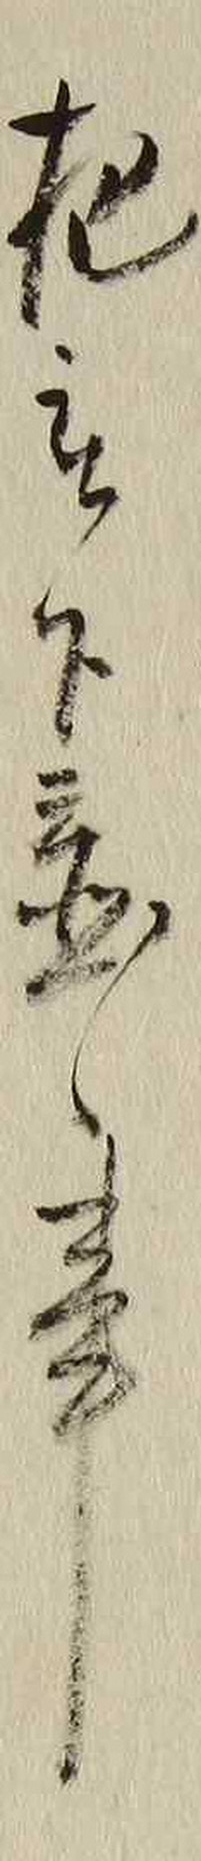把被下置候事
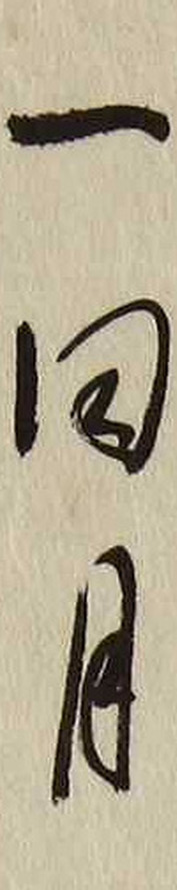一同月
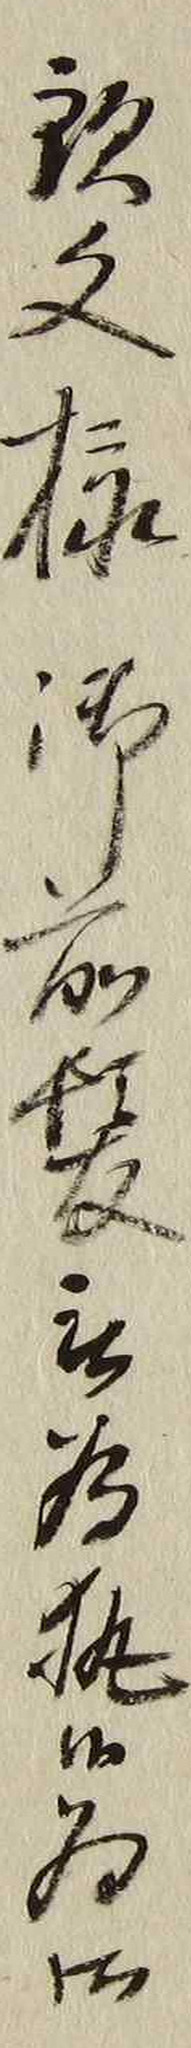欽文様御前髪被為執候為御
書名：諸士系譜　巻之351　す之部1
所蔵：会津若松市立会津図書館
